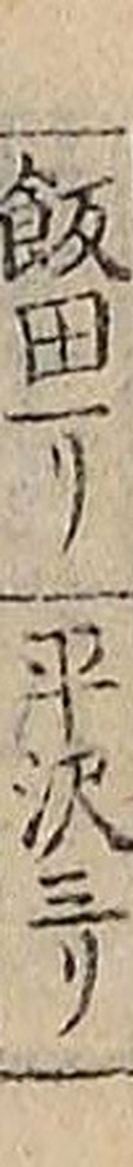飯田一リ平沢三リ
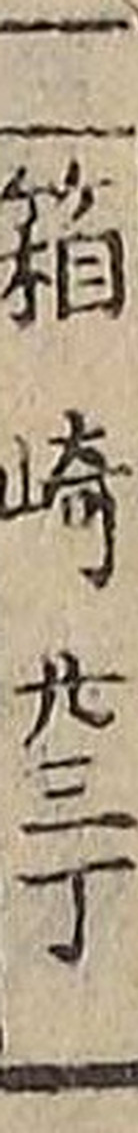箱崎廿三丁
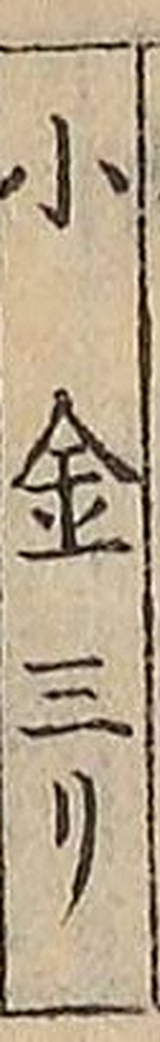小金三リ
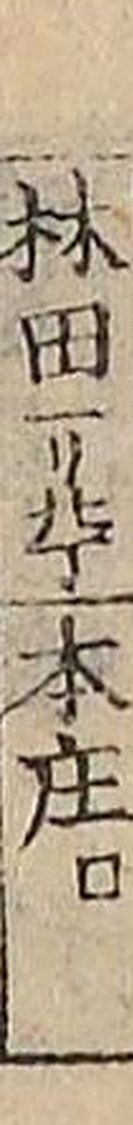林田一リ廿丁本庄口▫
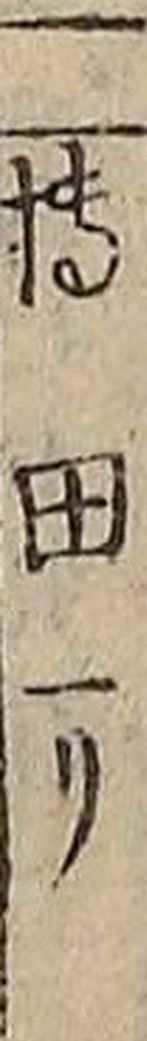持田一リ
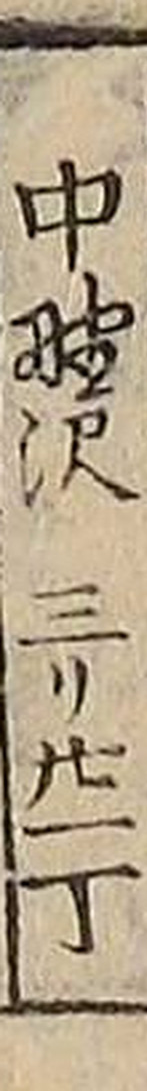中野沢三リ廿一丁
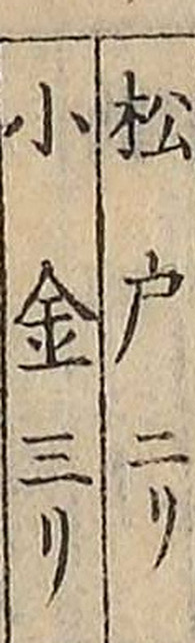小金三リ
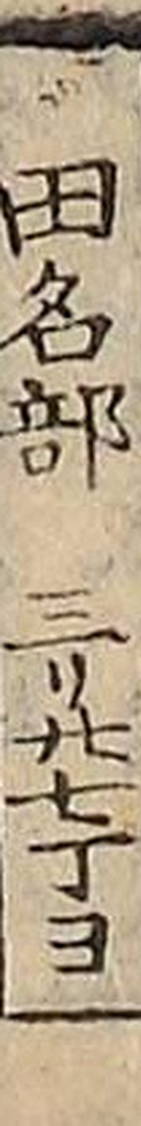田名部三リ廿七丁ヨ
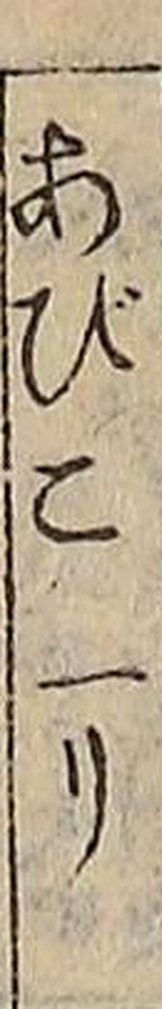あびこ一リ
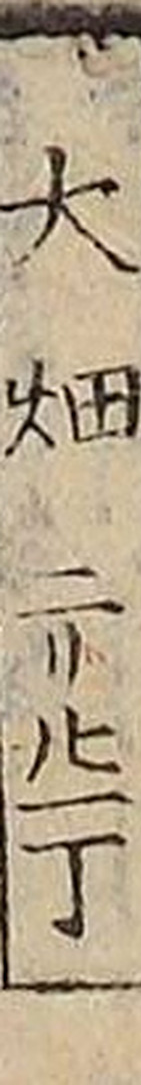大畑二リ廿一丁
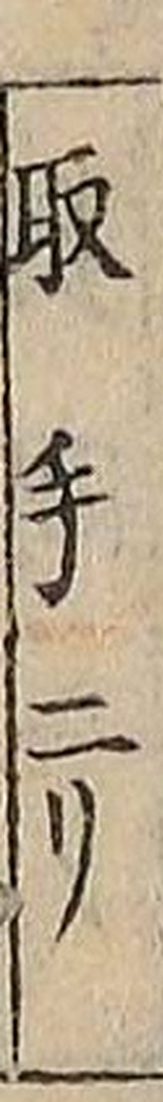取手二リ
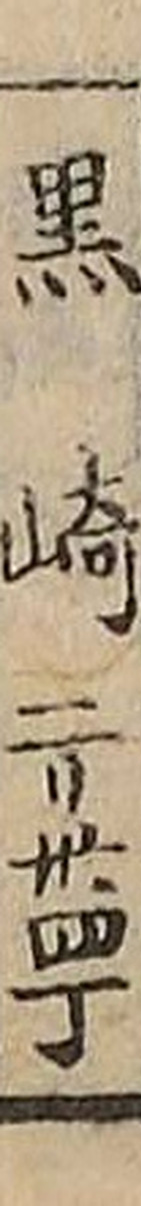黒崎二リ卅四丁
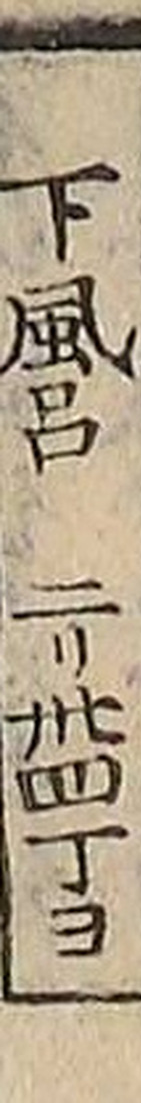下風呂二リ卅四丁ヨ
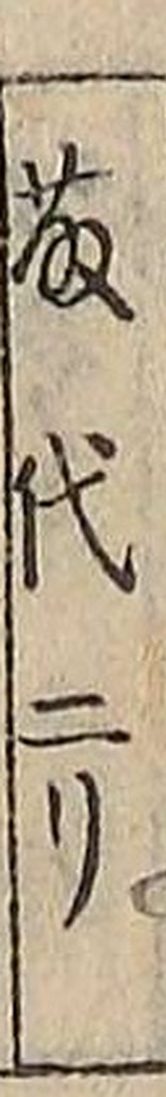藤代二リ
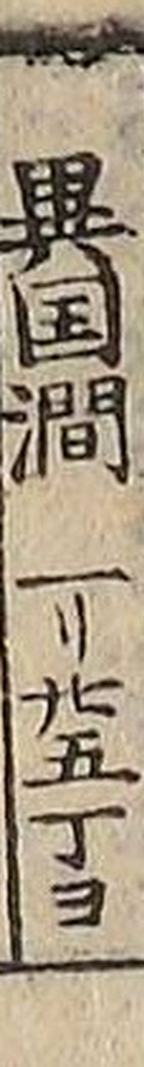異国澗一リ廿五丁ヨ
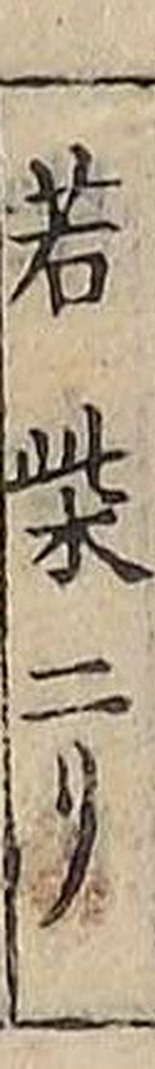若柴二リ
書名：旅行用心集
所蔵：神戸大学附属図書館 国文学研究資料館
